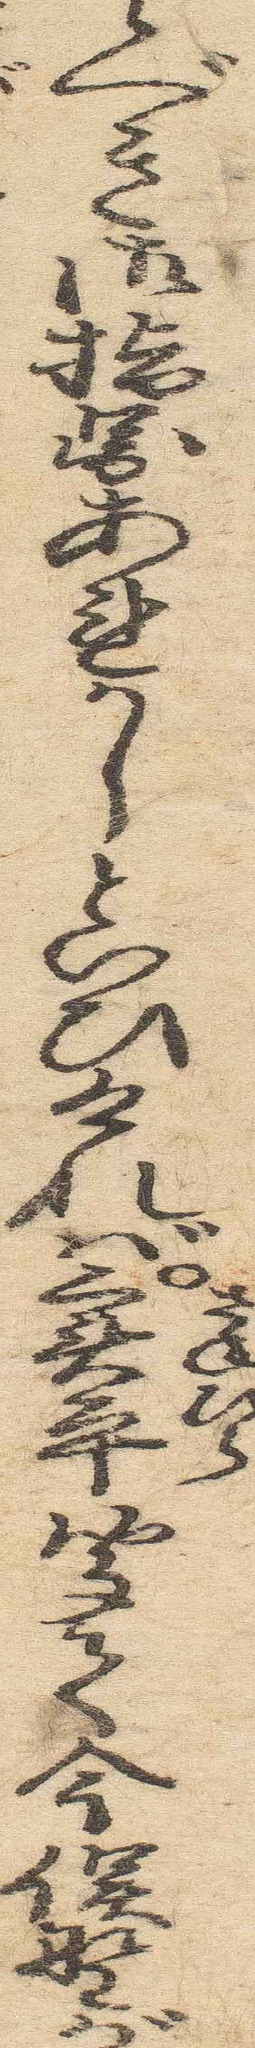候べき御指図あれかしといひければ。實平聞て今俣野が
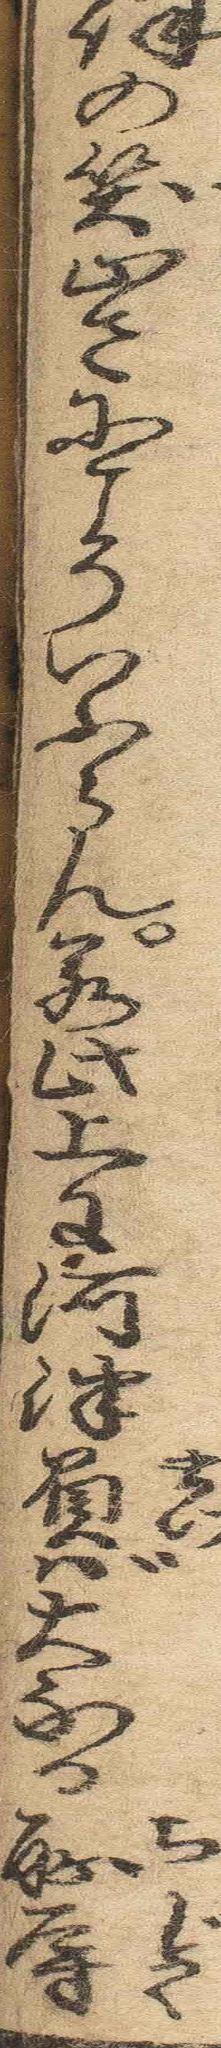詞の笑止さにこそいふらん。若此上に河津負ば大なる恥辱
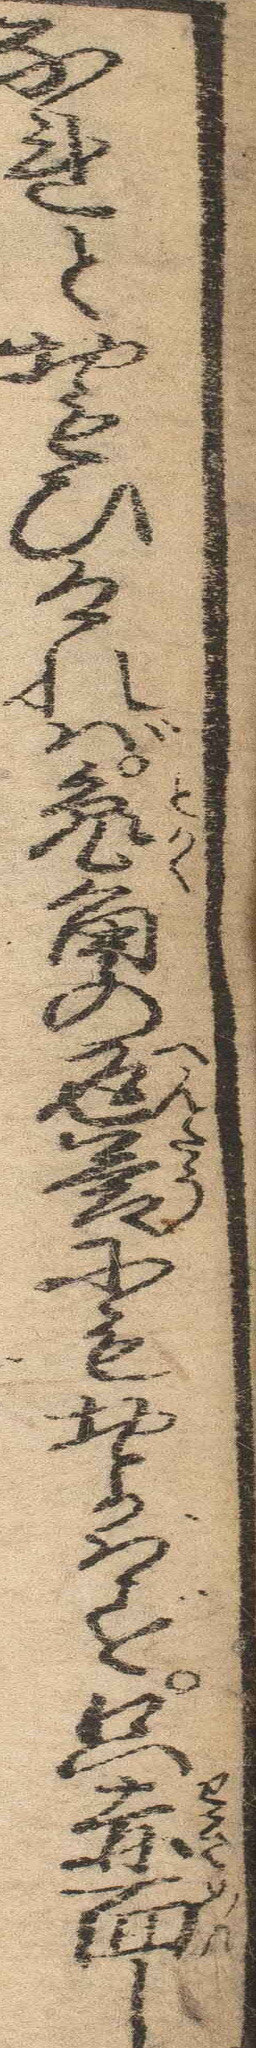なれとおもひければ。兎角の返答にもおよばず。只赤面し
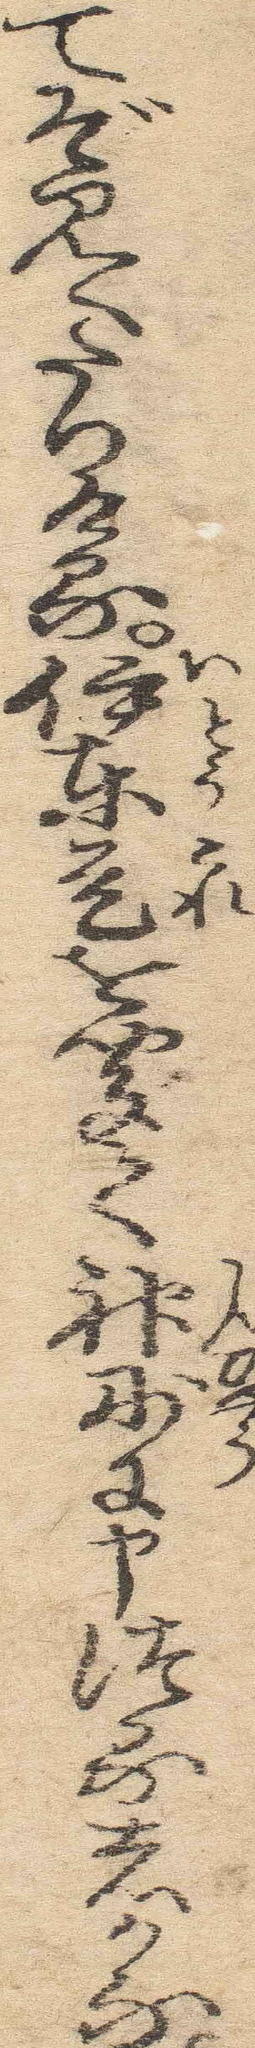てぞ見えたりける。伊東是を聞て神妙に申つるしかる。
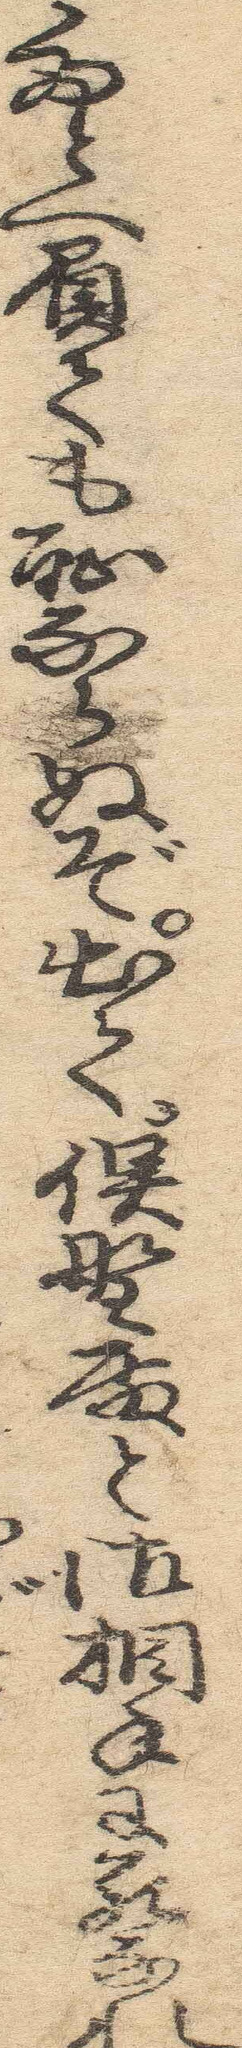たとへ負ても恥ならぬぞ。出て。俣野殿と御相手に罷なれ
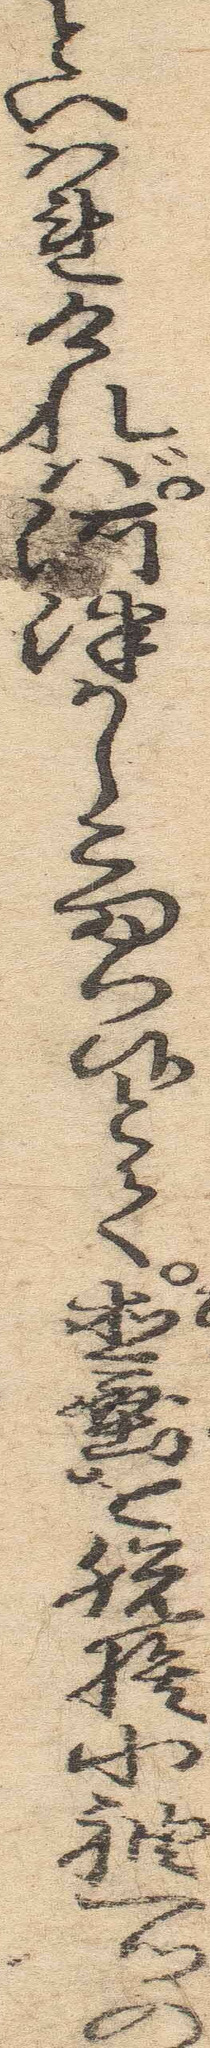といはれければ。河津かしこまり候とて。直垂を脱捨。小袖一つの
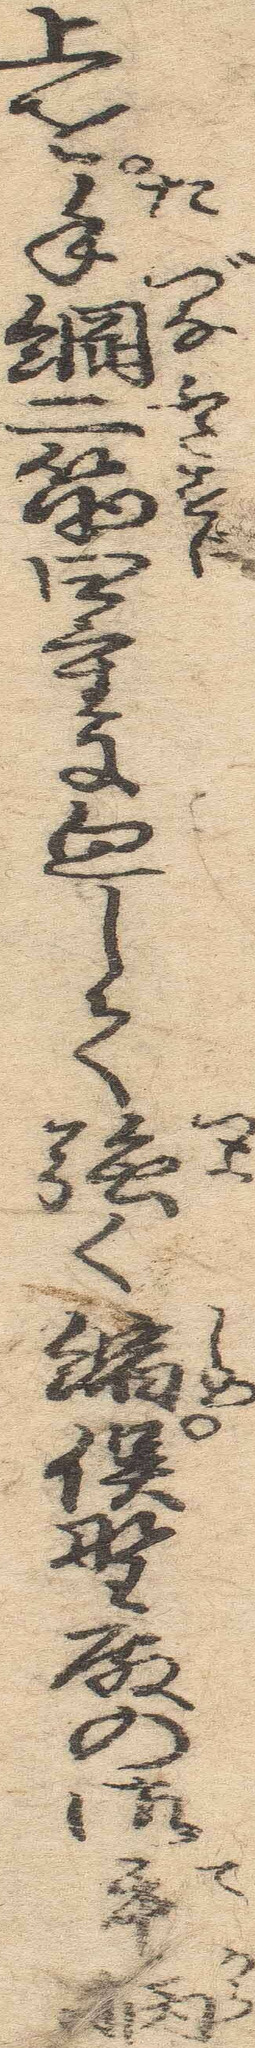上を。手綱二筋田字に廻して強く縮。俣野殿の御手柄
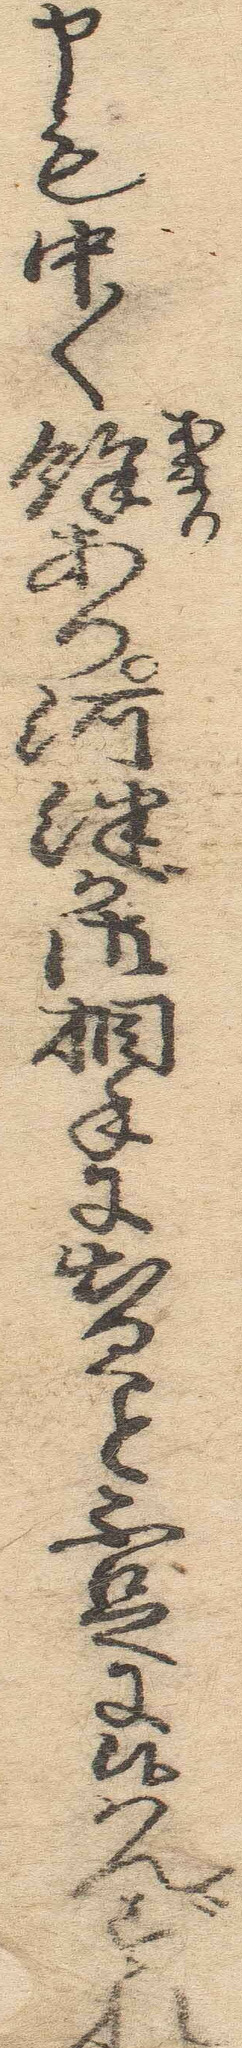申も中〳〵餘あり。河津が御相手に出ること不足に候はんずれ
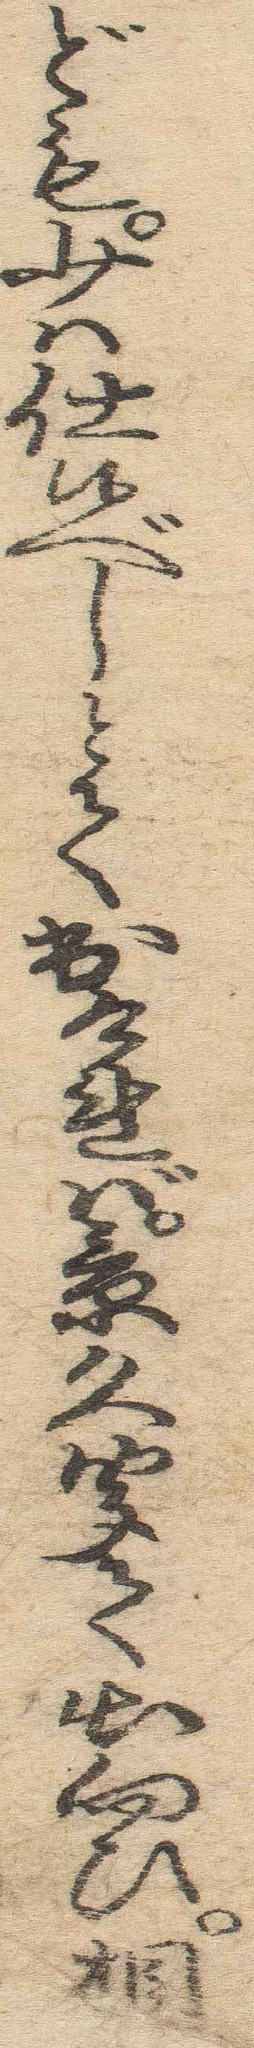ども。少は仕候べしとて出ければ。景久聞て出向ひ。相
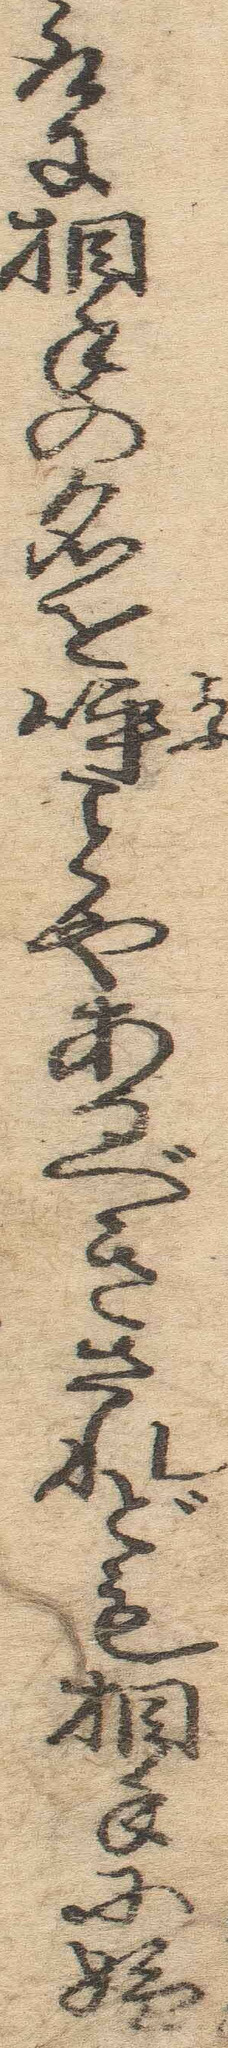取に相手の名を呼ことやあるべきされども相手に嫌
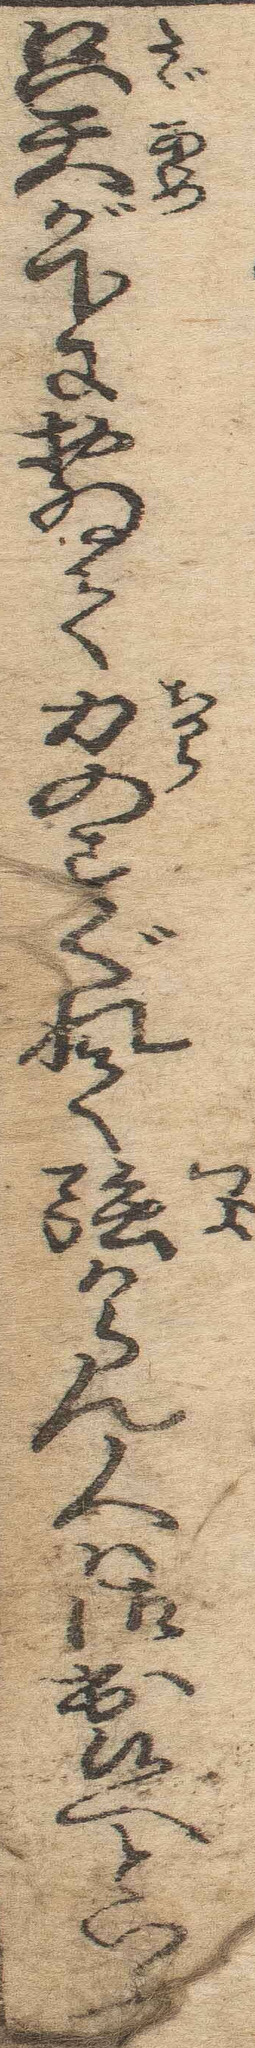只天が下におゐて力のすぐれて強からん人は御出候へとい

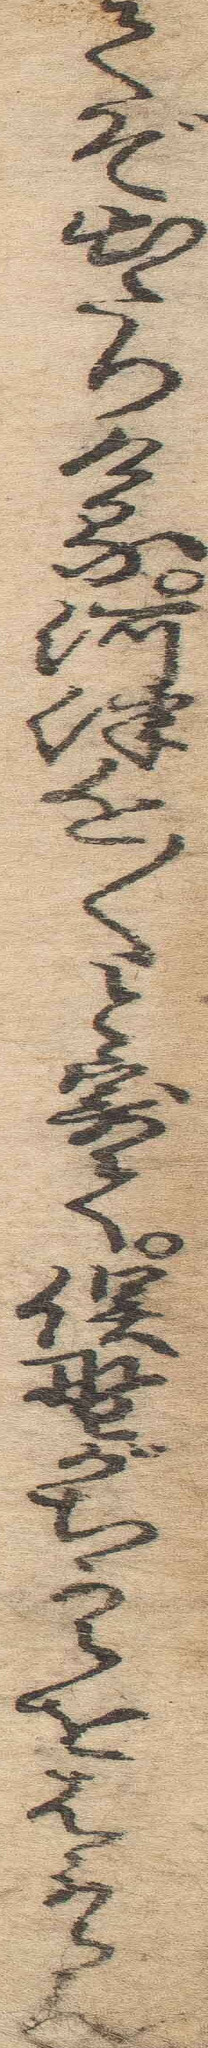てぞ出たりける。河津近〳〵と寄て。俣野がちからをはからん
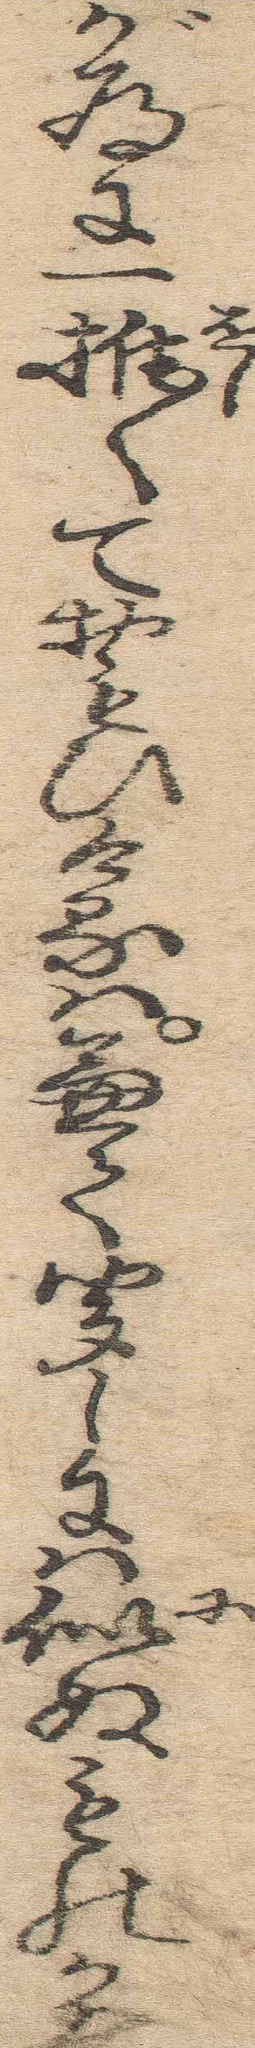が為に一推しておもひけるは。兼々聞しには似ぬものか
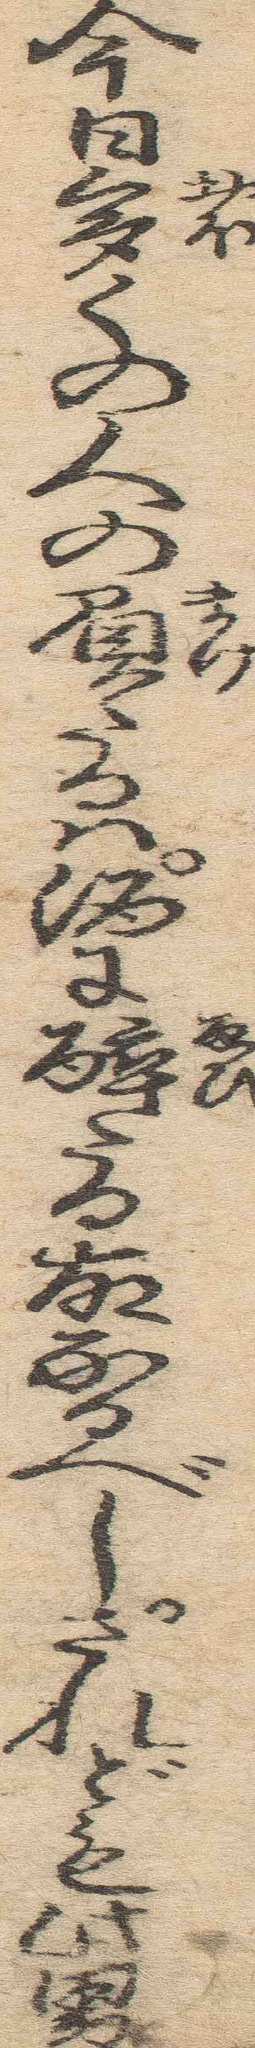今日多くの人の負たるは。酒に酔たる故なるべし。されども此男
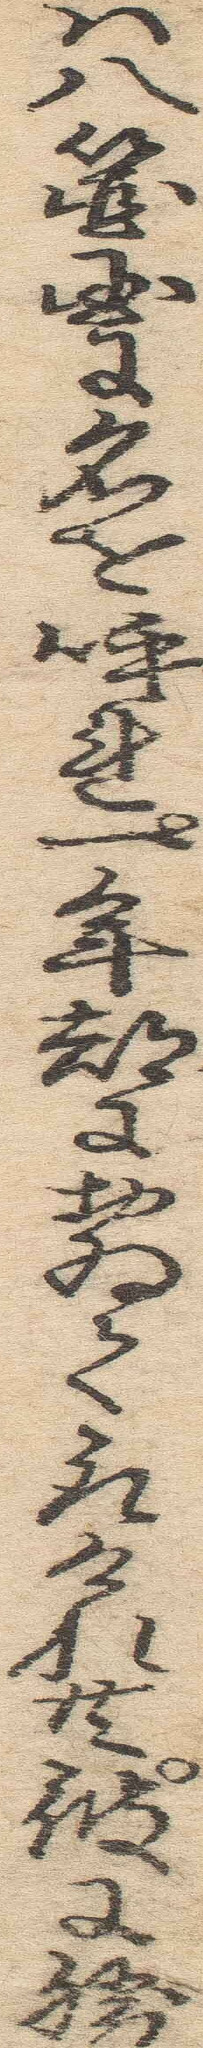は八箇国に名を呼れ。一年都におゐて取けれ共。彼に勝
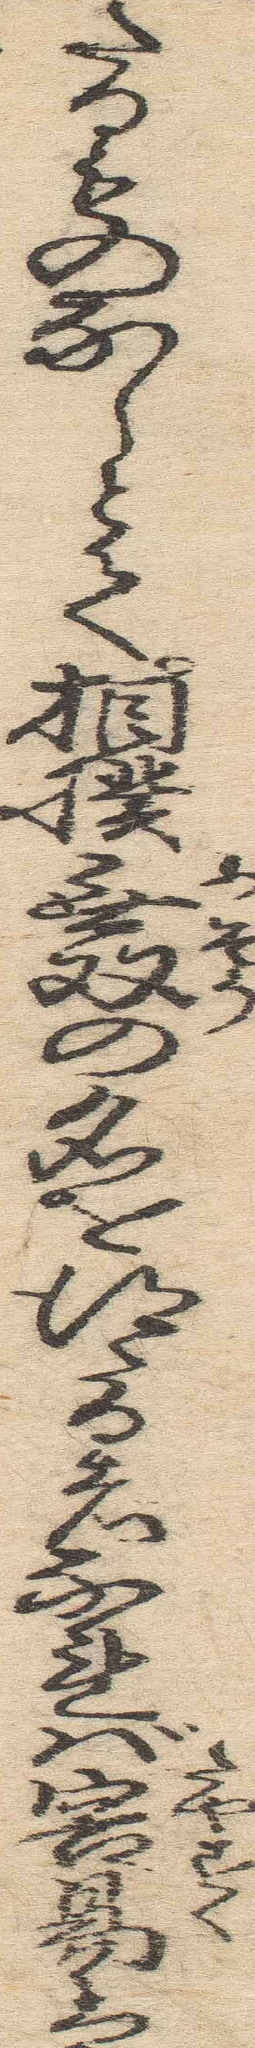たるものなしとて。相撲無双の名を得たる者なれば容易は
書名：古今相撲大全
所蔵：東京学芸大学附属図書館 国文学研究資料館
